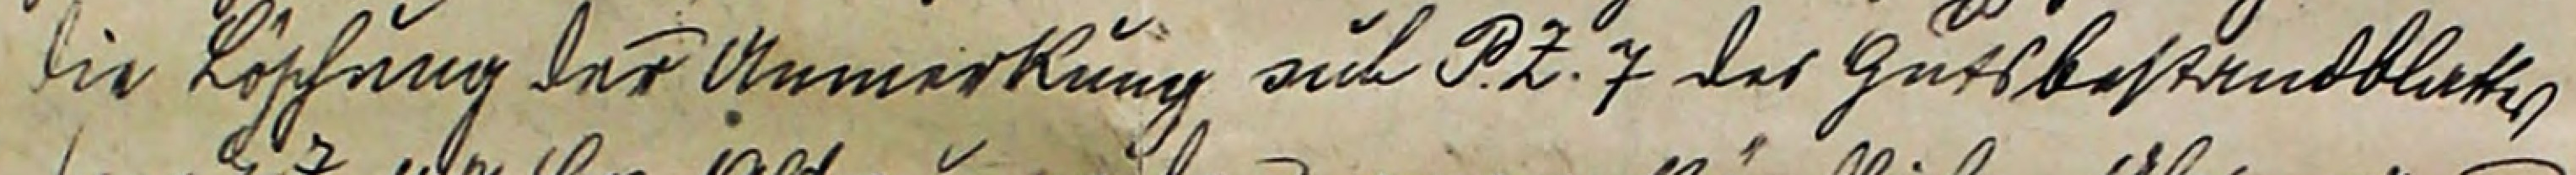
die Löschung der Anmerkung such P.Z. 7 des Gutsbestandblattes
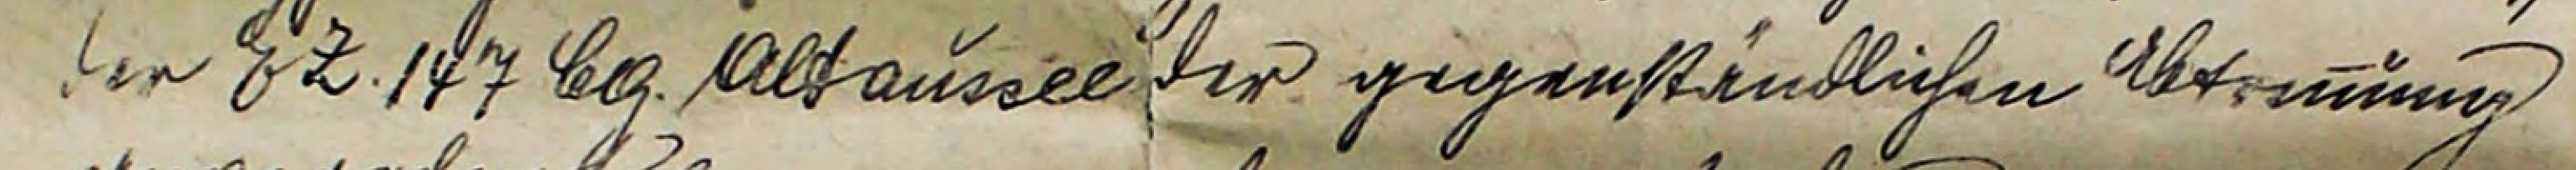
der EZ. 147 Cg. Altaussee der gegenständlichen Abtrennung
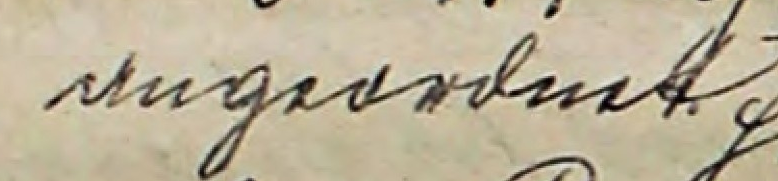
angeordnet.
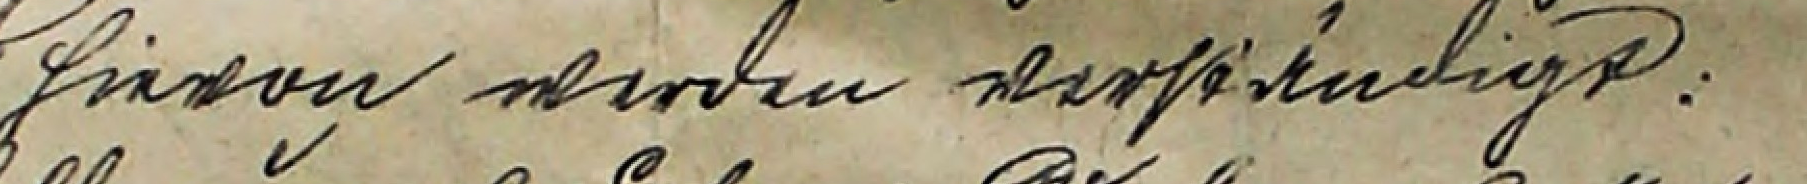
Hievon werden verständigt:
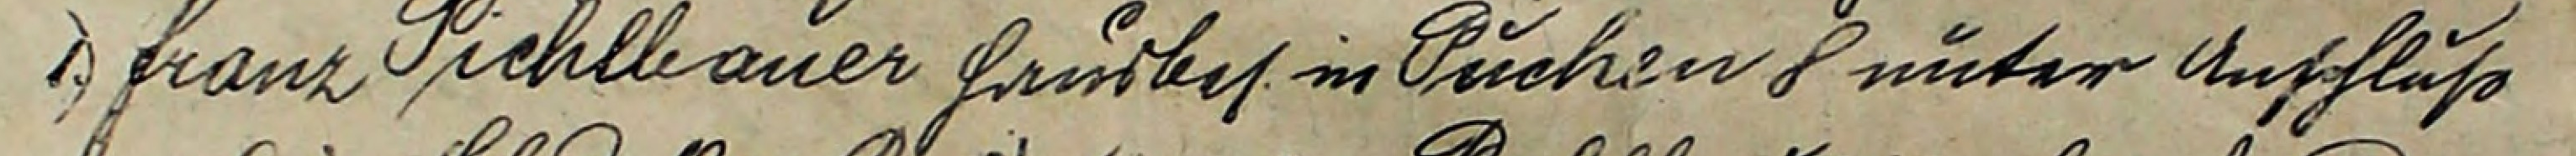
1.) Franz Pichlbauer Hausbes. in Puchen 8 unter Anschluss
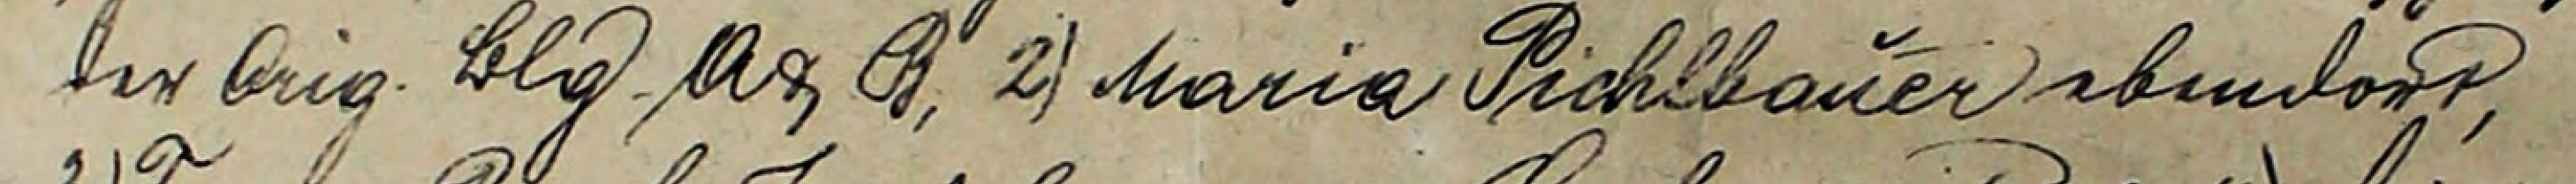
der Orig. Blg. A & B, 2) Maria Pichlbauer ebendort,
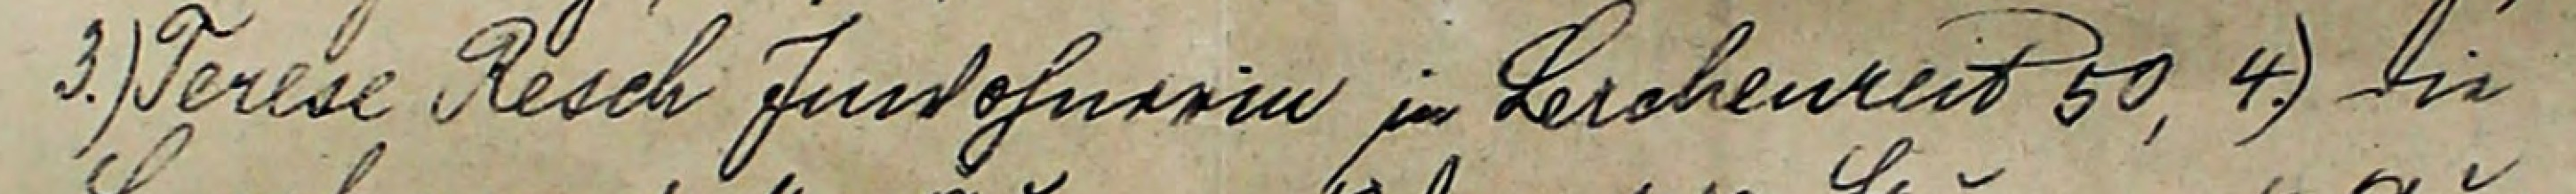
3.) Terese Resch Jnwohnerin in Lerchenreit 50, 4.) Die
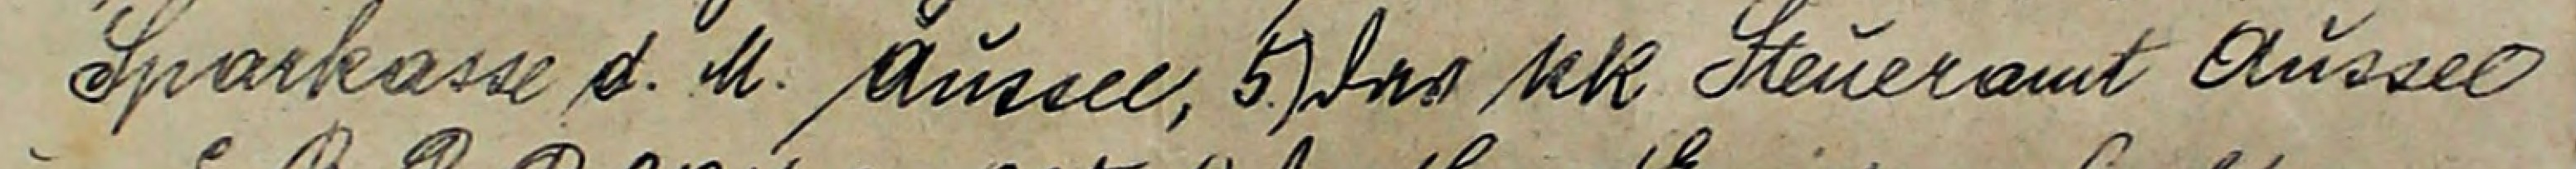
Sparkasse d. M. Aussee, 5.) Das kk Steueramt Aussee
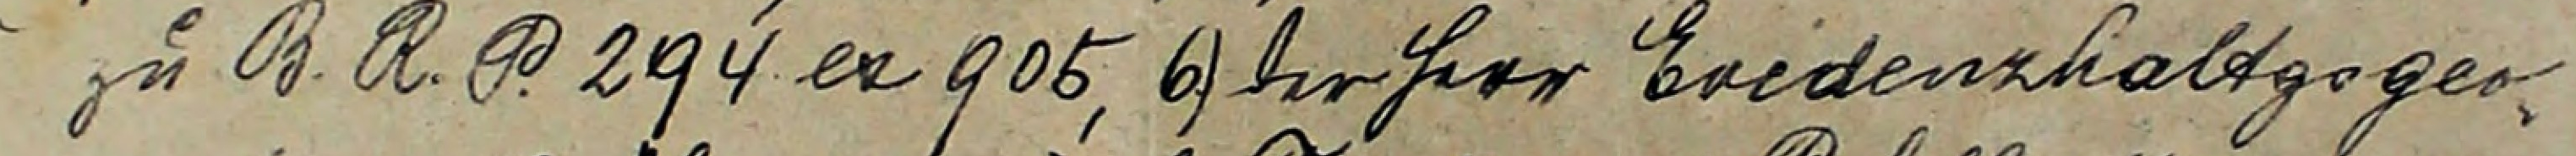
zu B.R.P. 294. et 905, 6.) Der Herr Evidenzhaltgsgeo„
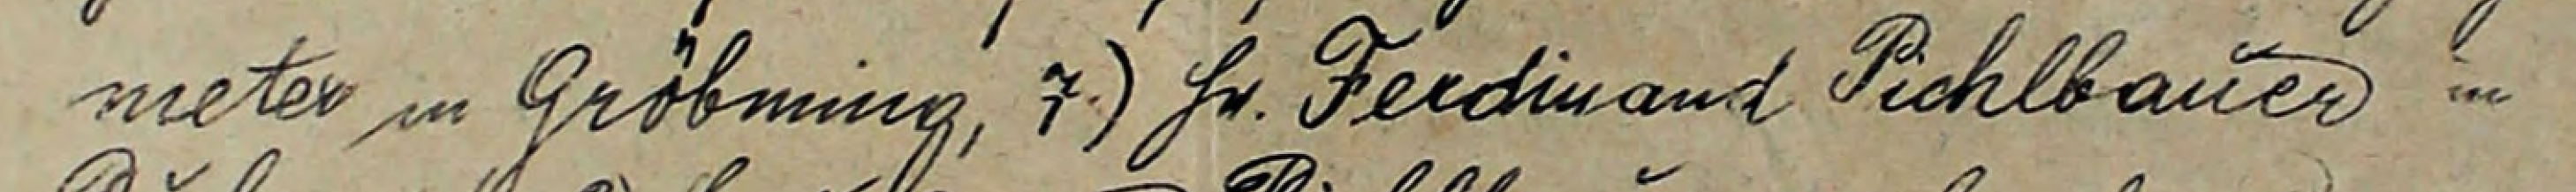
meter in Gröbming, 7.) Hr. Ferdinand Pichlbauer in
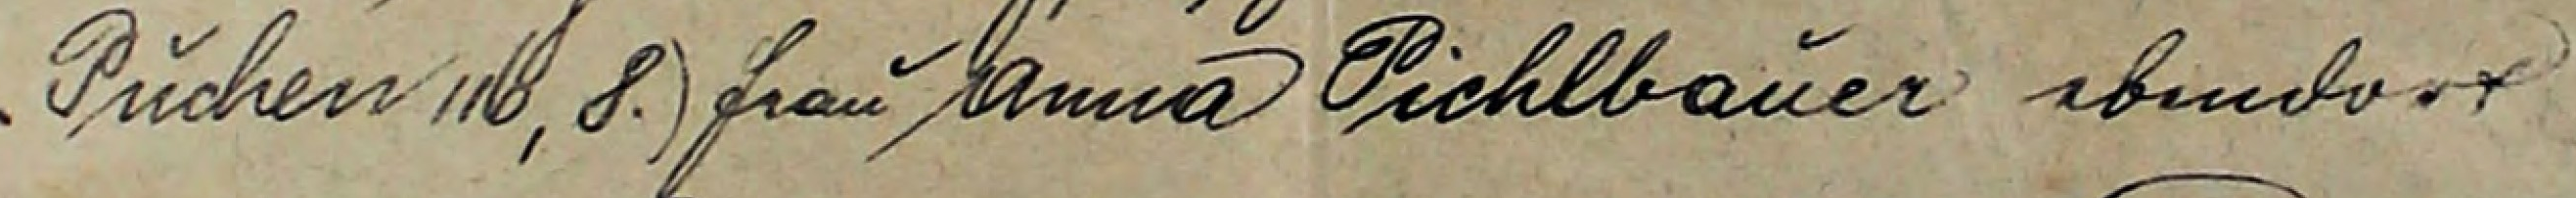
Puchen 116, 8.) Frau Anna Pichlbauer ebendort
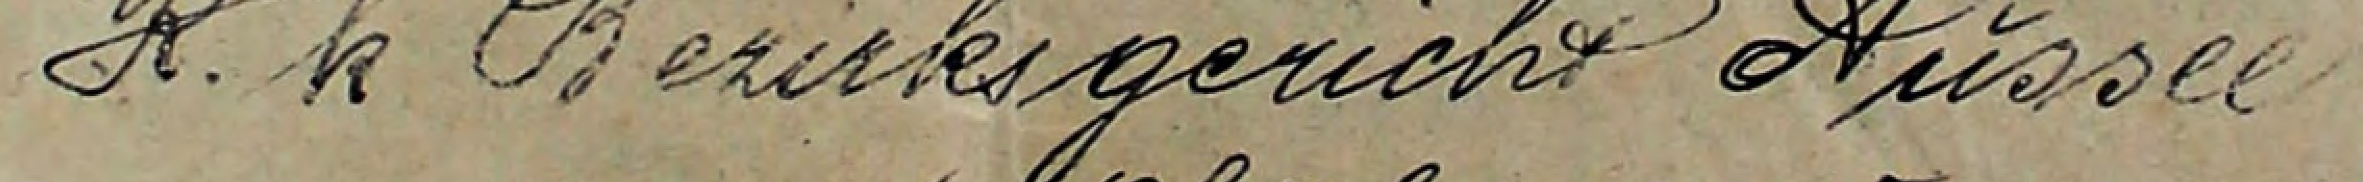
K. k Bezirksgericht Aussee
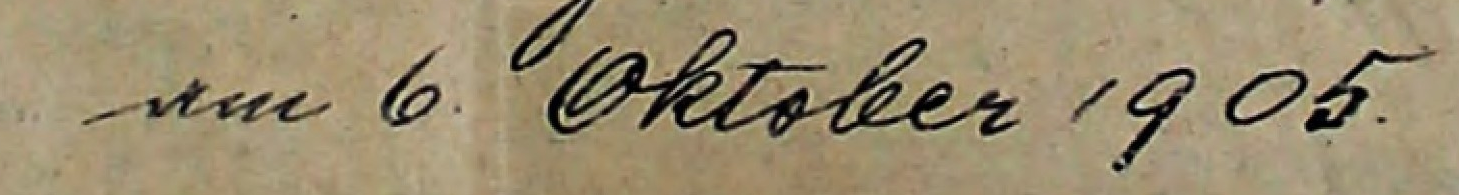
am 6. Oktober 1905
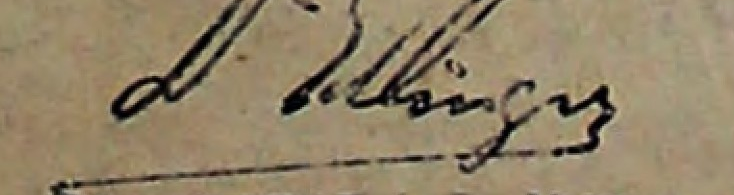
D???
